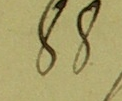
88
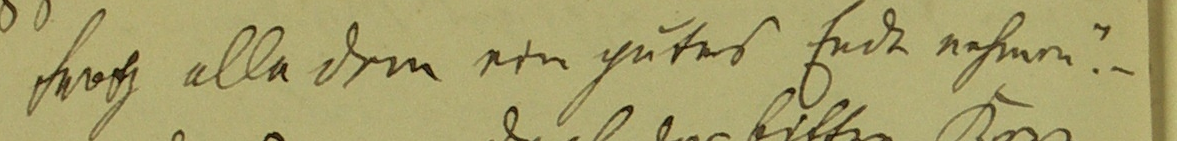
trotz alledem ein gutes Ende nehmen.-
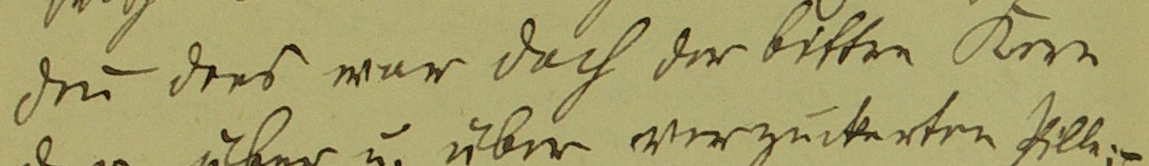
Denn dies war doch der bittere Kern
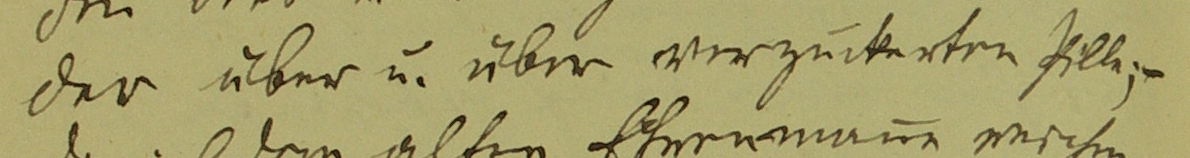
der über und über verzuckerten Pille.-
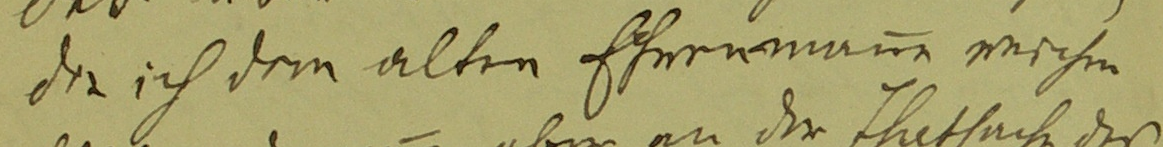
die ich dem alten Ehrenmann reichen
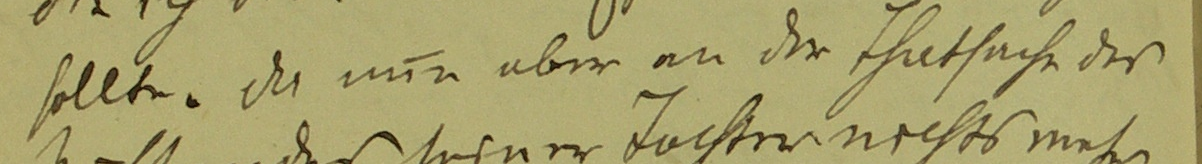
sollte. Da nun aber an der Thatsache des
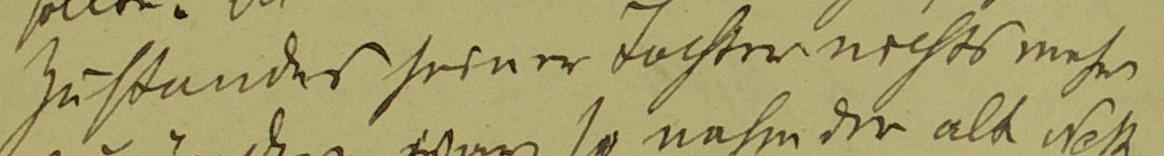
Zustandes seiner Tochter nichts mehr
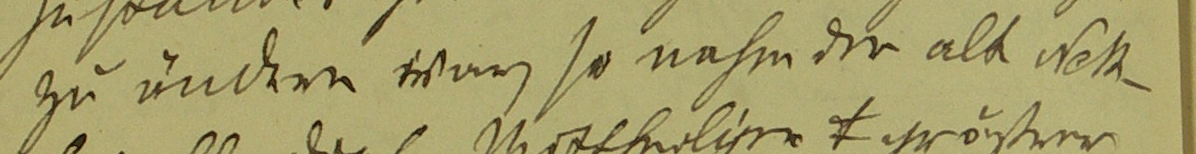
zu ändern war so nahm der alte Neck¬
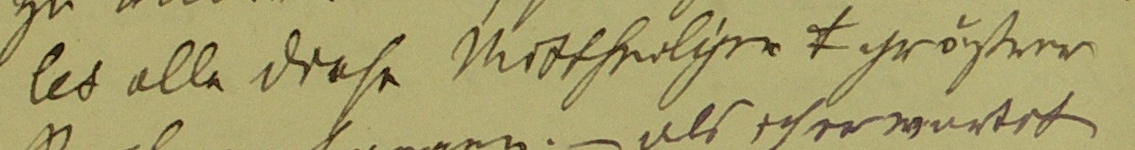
les alle diese Mittheilungen mit größerer
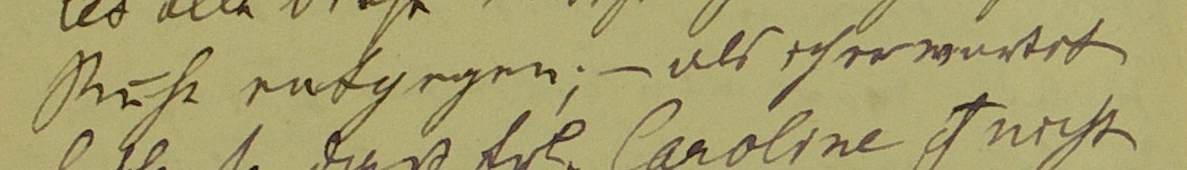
Ruhe entgegen; - als ich erwartet
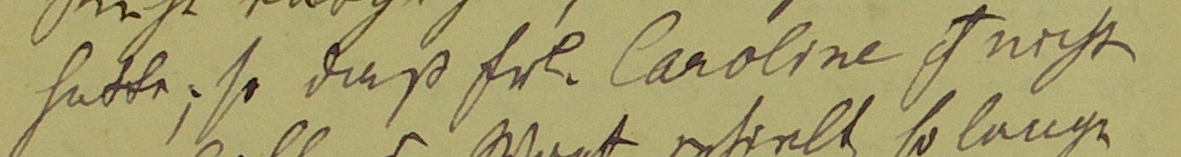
hatte,so daß Frl. Caroline auch nicht
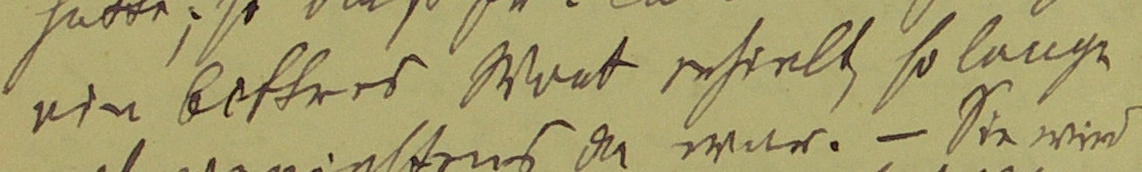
ein bitteres Wort erhielt so lange
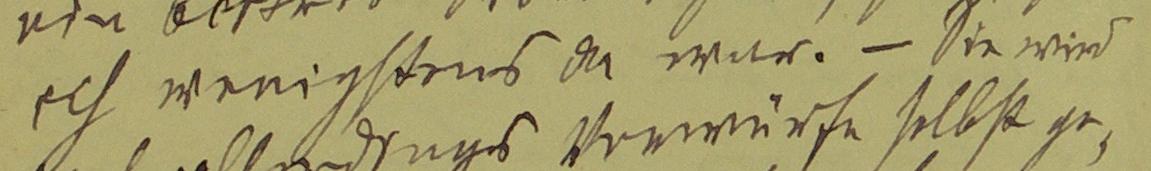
ich wenigstens da war,- Sie wird
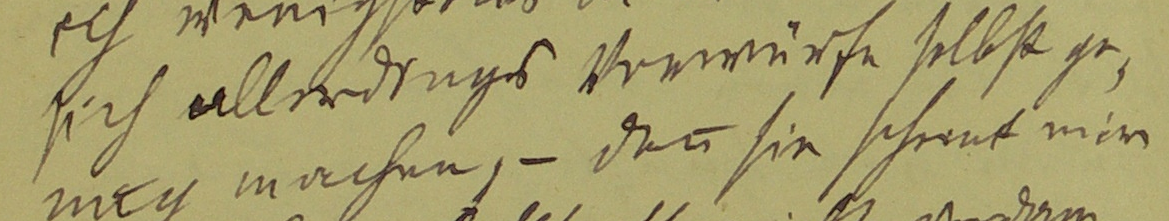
sich allerdings Vorwürfe selbst ge¬
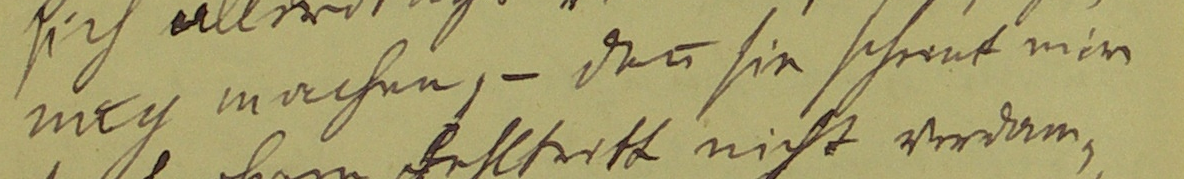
nug machen, denn sie scheint mir
